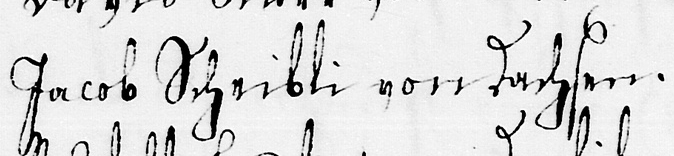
Jacob Scheibli von Dachsen.
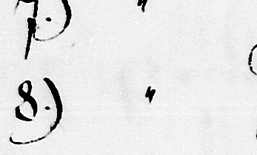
9.) “
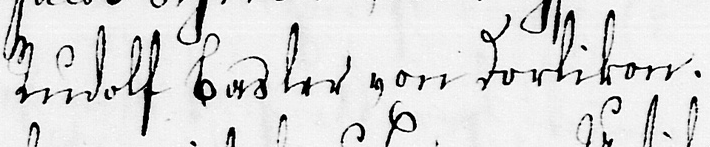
Rudolf Basler von Dorlikon.
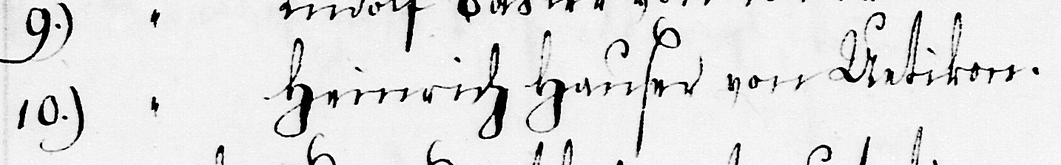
10.) “ Heinrich Hauser von Uetikon.
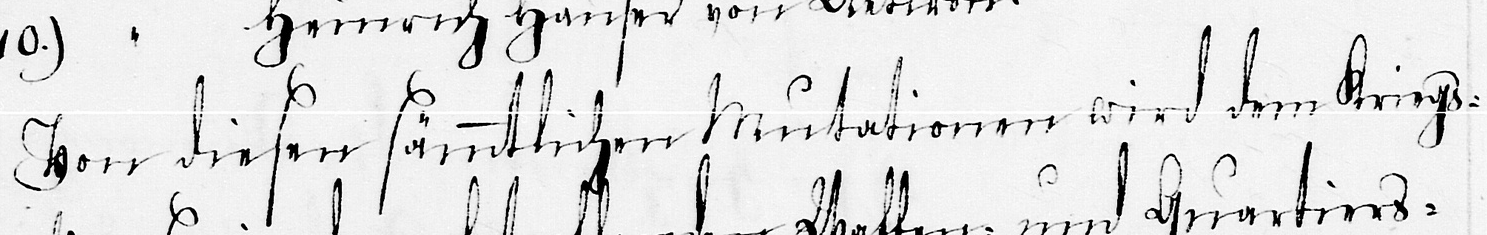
Von diesen sämmtlichen Mutationen wird dem Kriegs¬
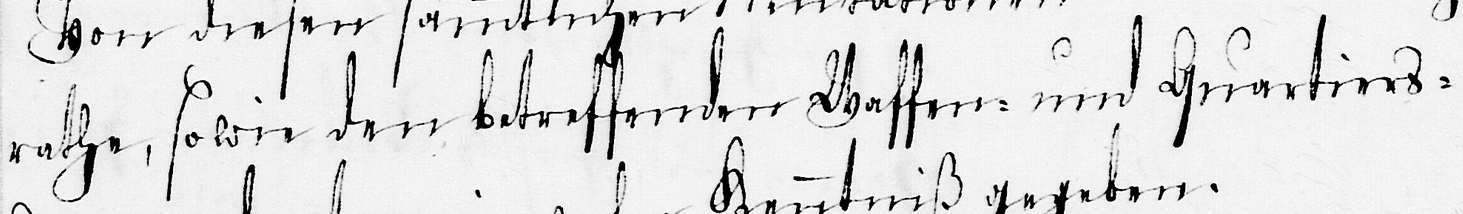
rathe, sowie den betreffenden Waffen- und Quartier¬
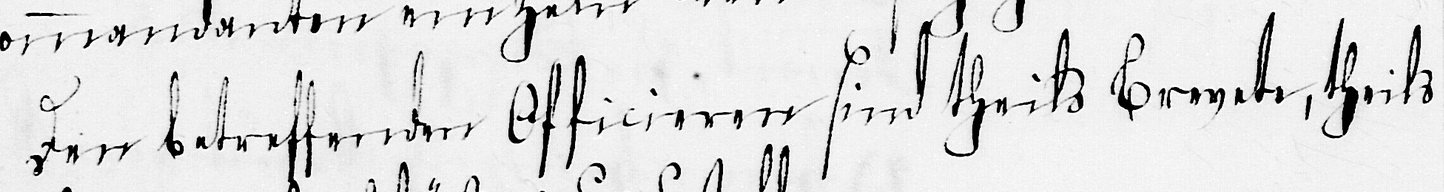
Den betreffenden Officieren sind theils Brevete, theils
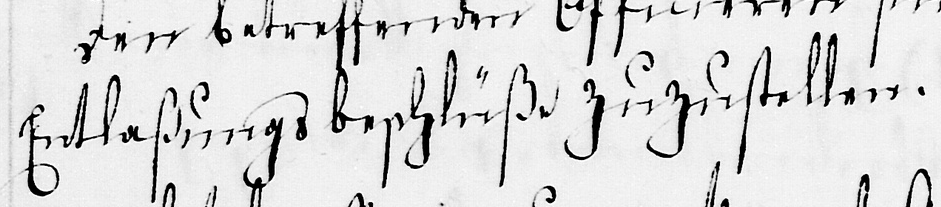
Entlaßungsbeschlüße zuzustellen.
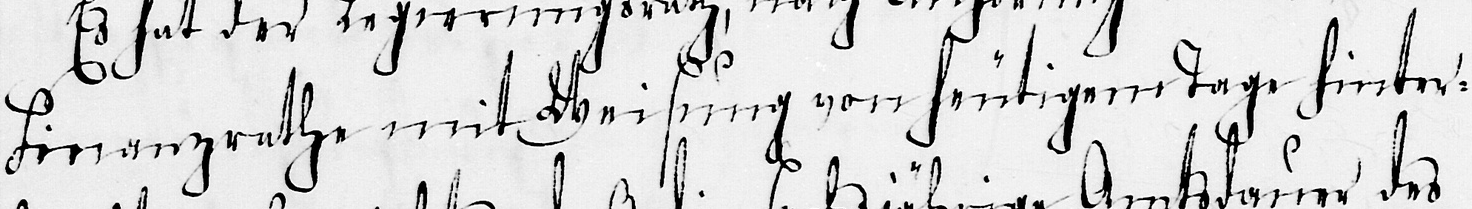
Finanzrathe mit Weisung von heutigem Tage hinter¬
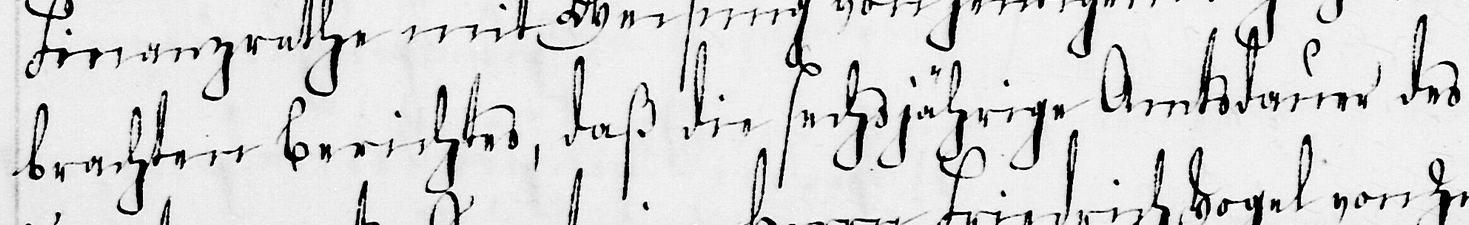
brachten Berichtes, daß die sechsjährige Amtsdauer des
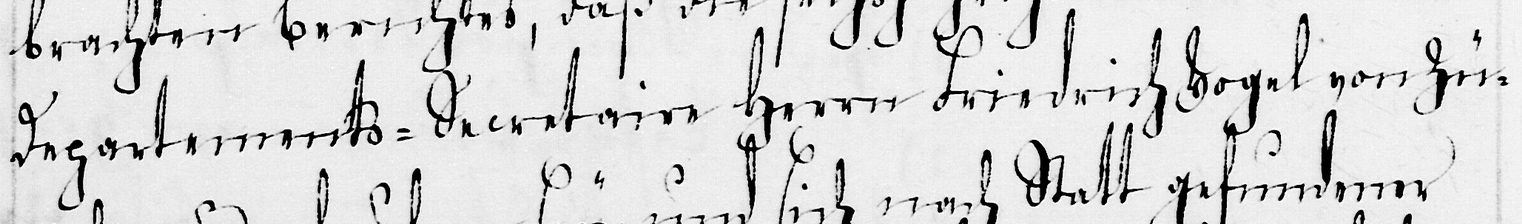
Departements-Secretaire Herrn Friedrich Vogel von Zü¬
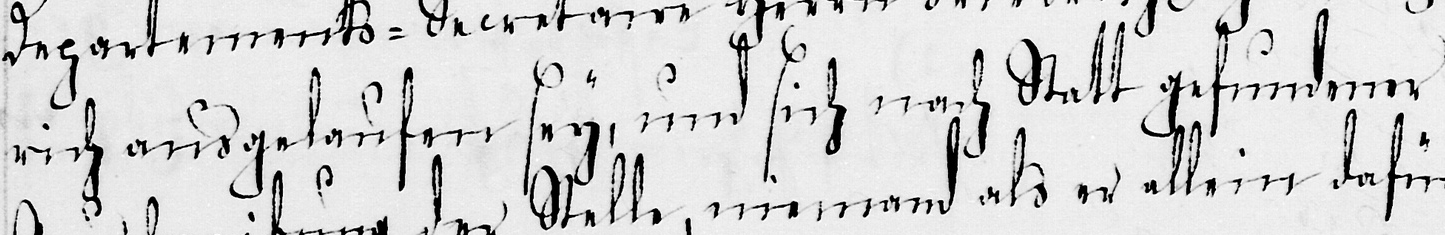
rich ausgelaufen sey, und sich nach Statt gefundener
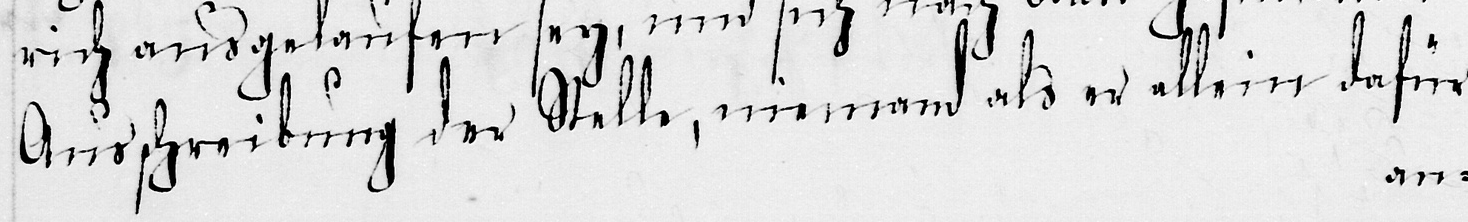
Ausschreibung der Stelle, niemand als er allein dafür
